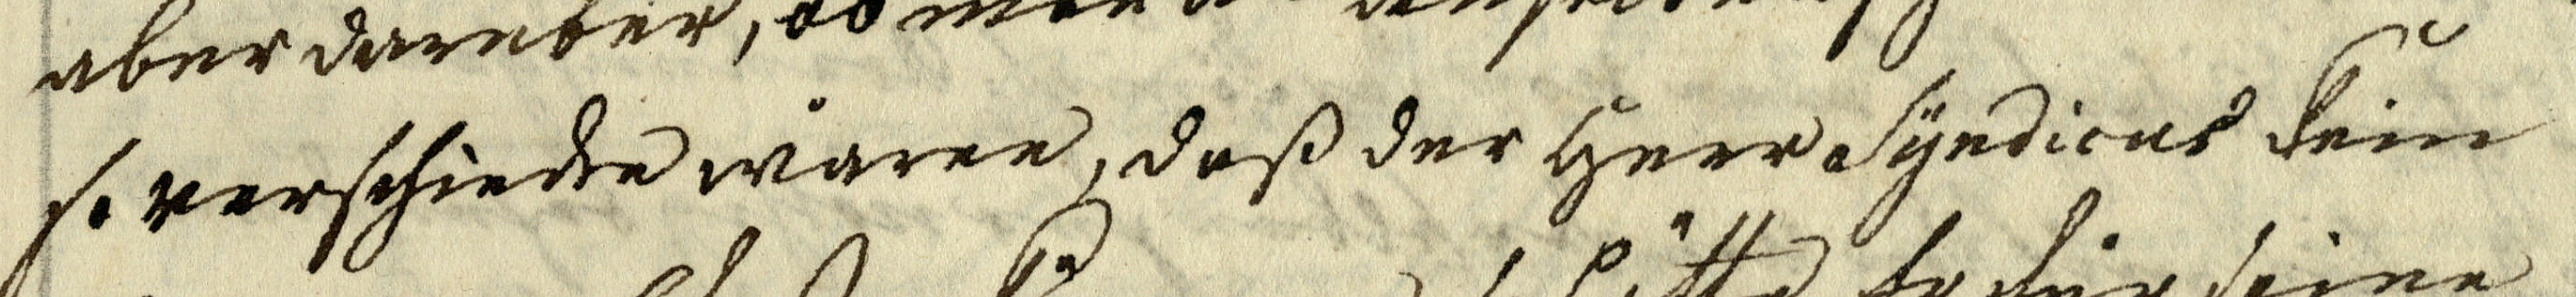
so verschieden wären, daß der Herr Sÿndicus kein
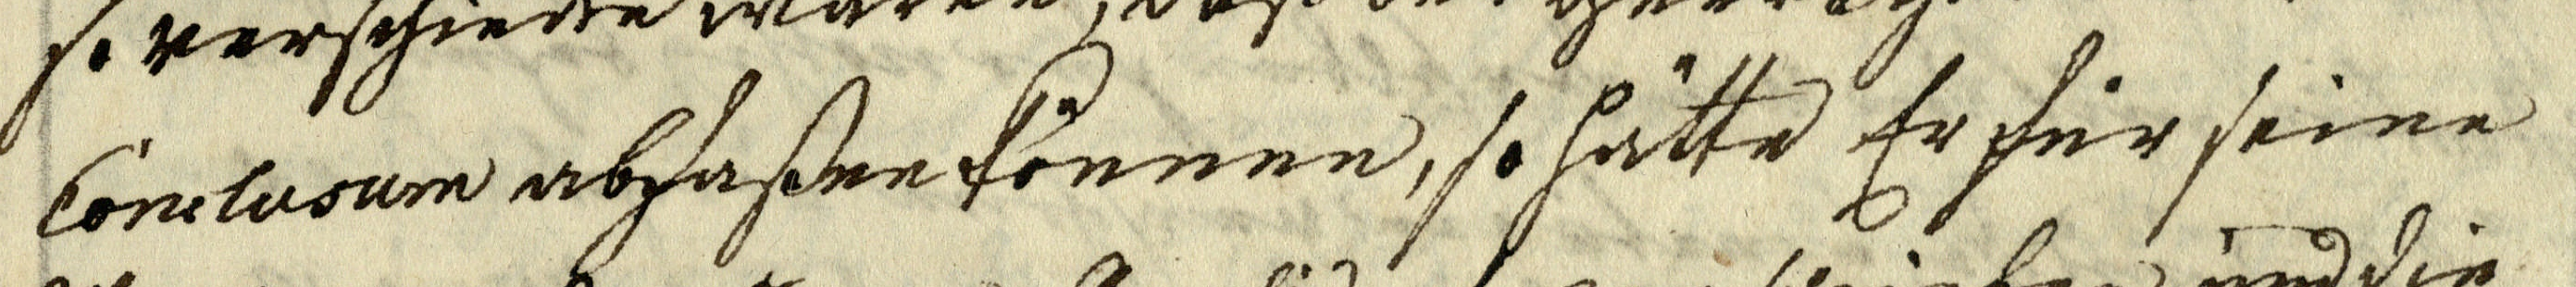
Conclusum abfaßen können, so hätte Er für seine
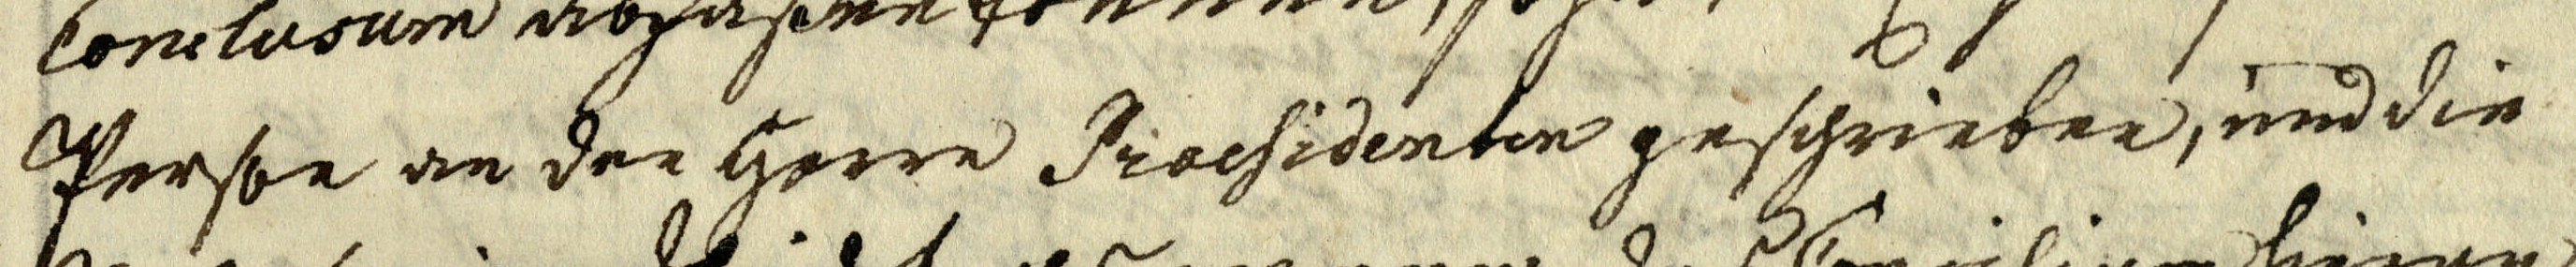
Person an den Herrn Praesidenten geschrieben, und die
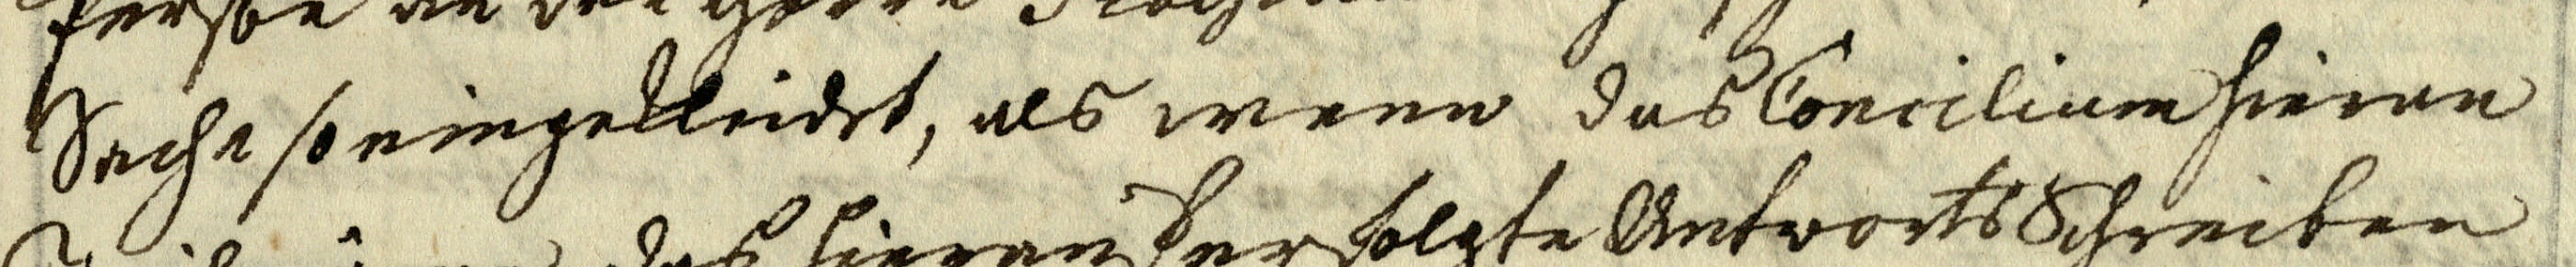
Sache so eingekleidet, als wenn das Concilium hieran
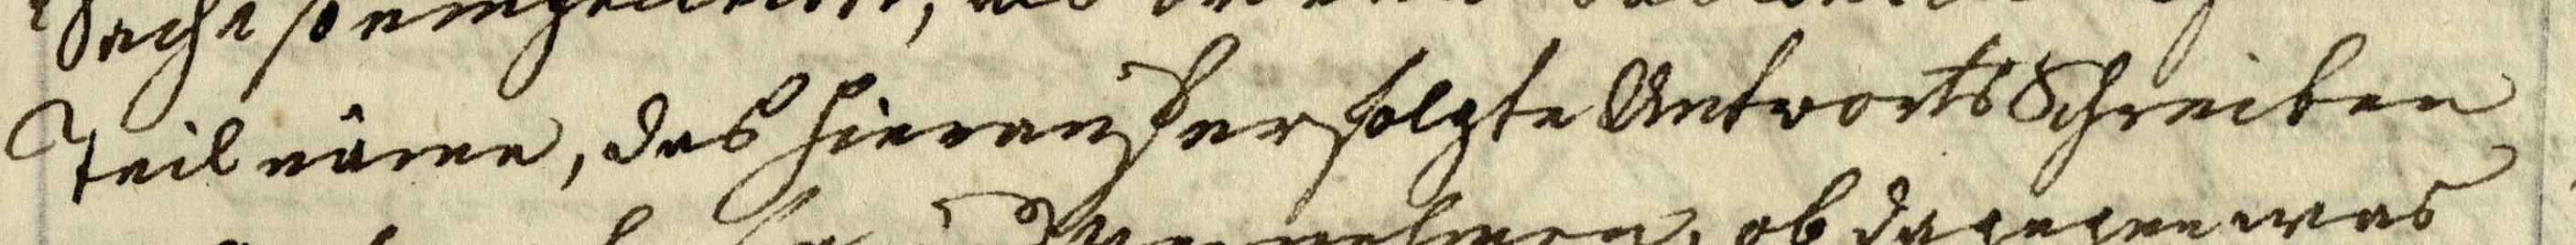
Teil näme, das hierauferfolgte AntwortsSchreiben
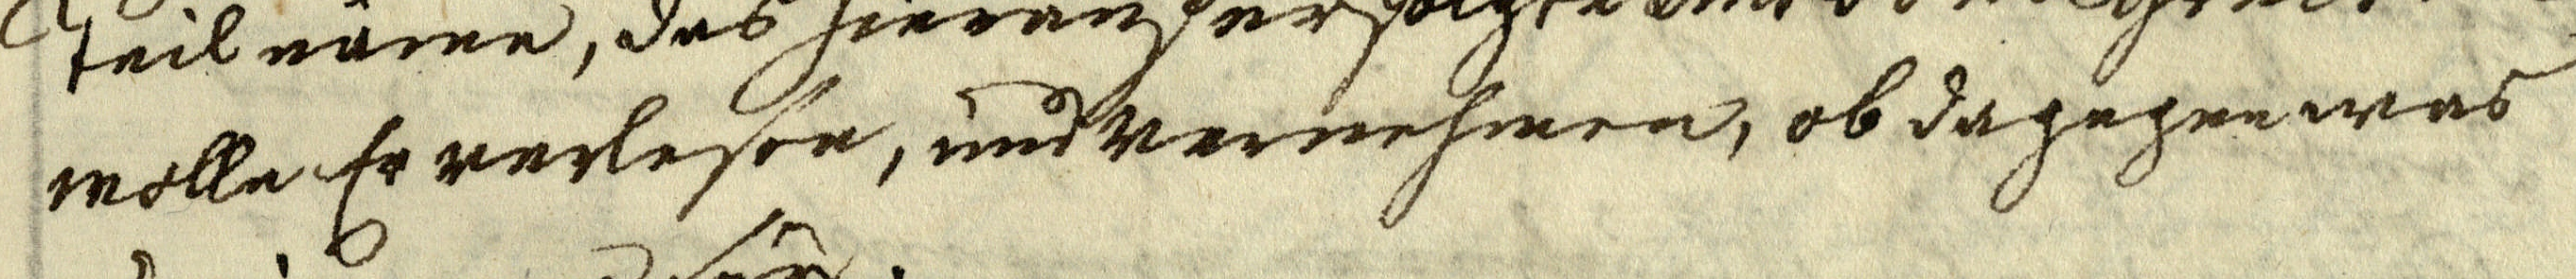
wolle Er verlesen, und vernehmen, ob dagegen was
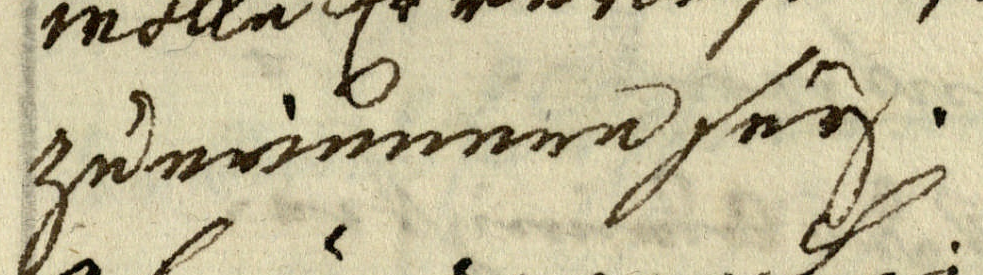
zu erinnern seÿ.
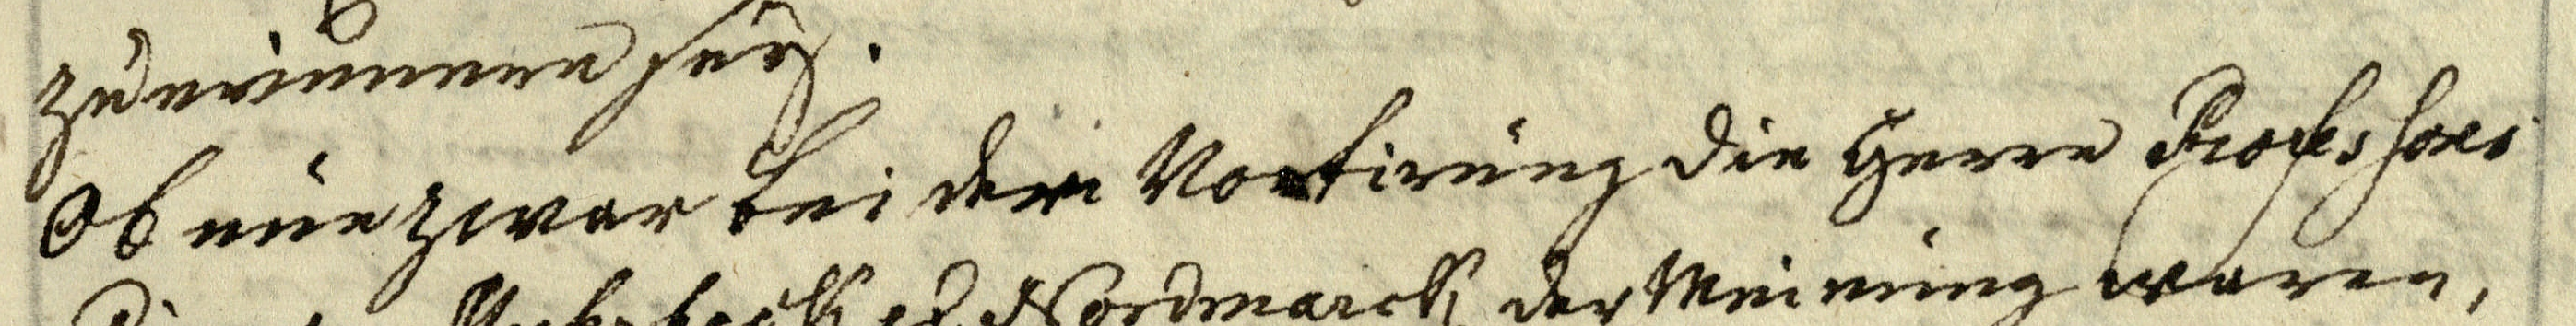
Ob nunzwar bei der Votirung die Herrn Professores
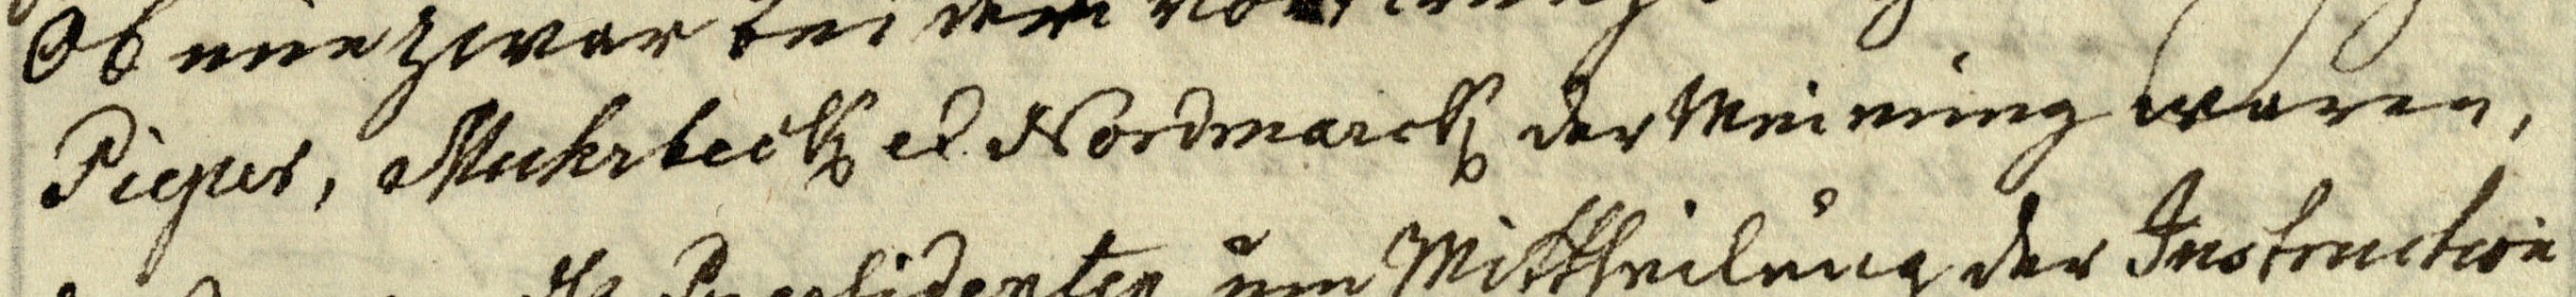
Piper, Muhrbeck et Nordmarck der Meinung waren,
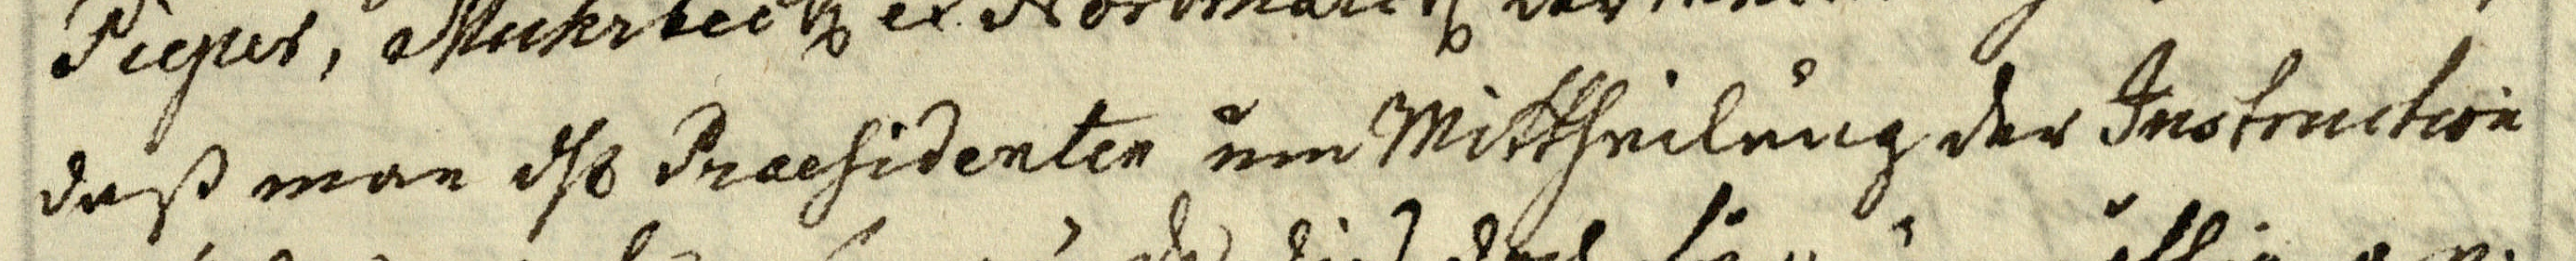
daß man dh Praesidenten um Mittheilung der Instruction
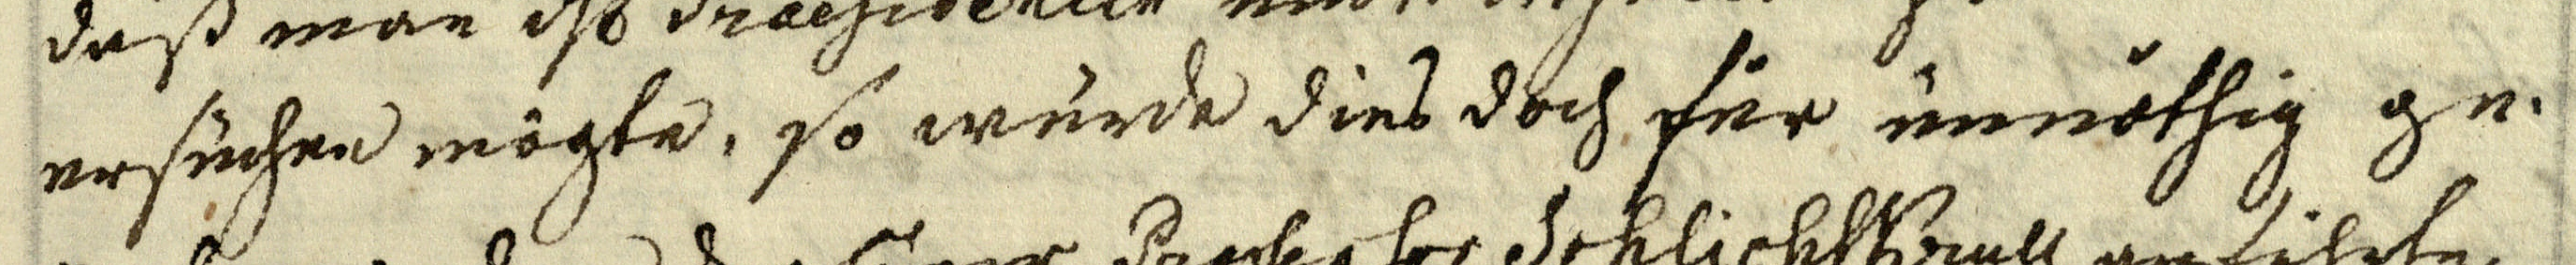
ersuchen mögte, so würde dies doch für unnöthig ge¬
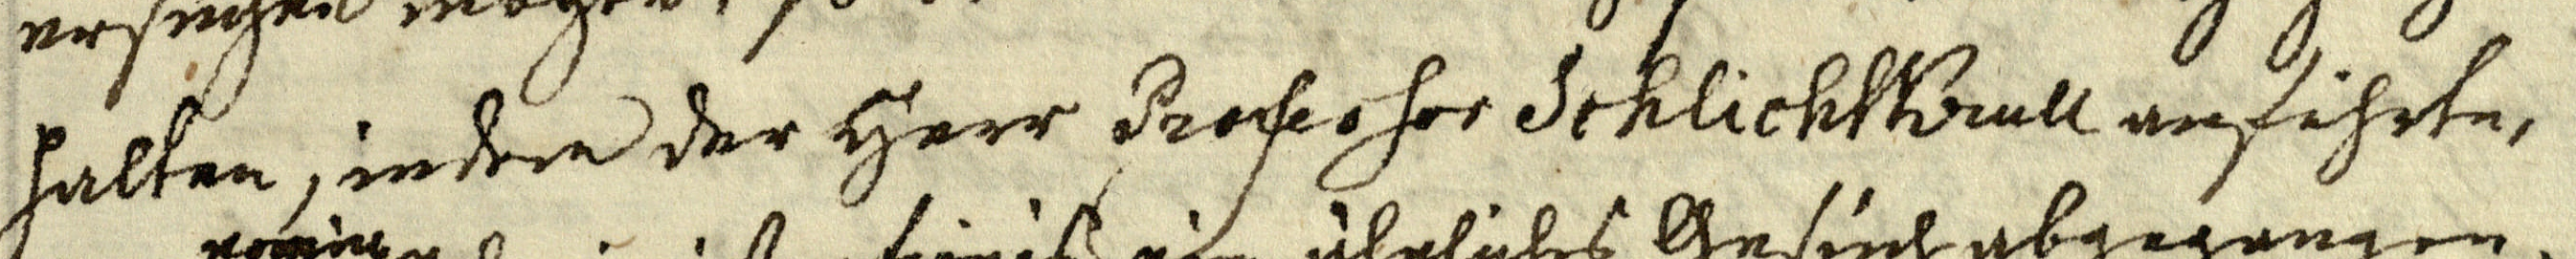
halten, indem der Herr Professor Schlichtkrull anführte,
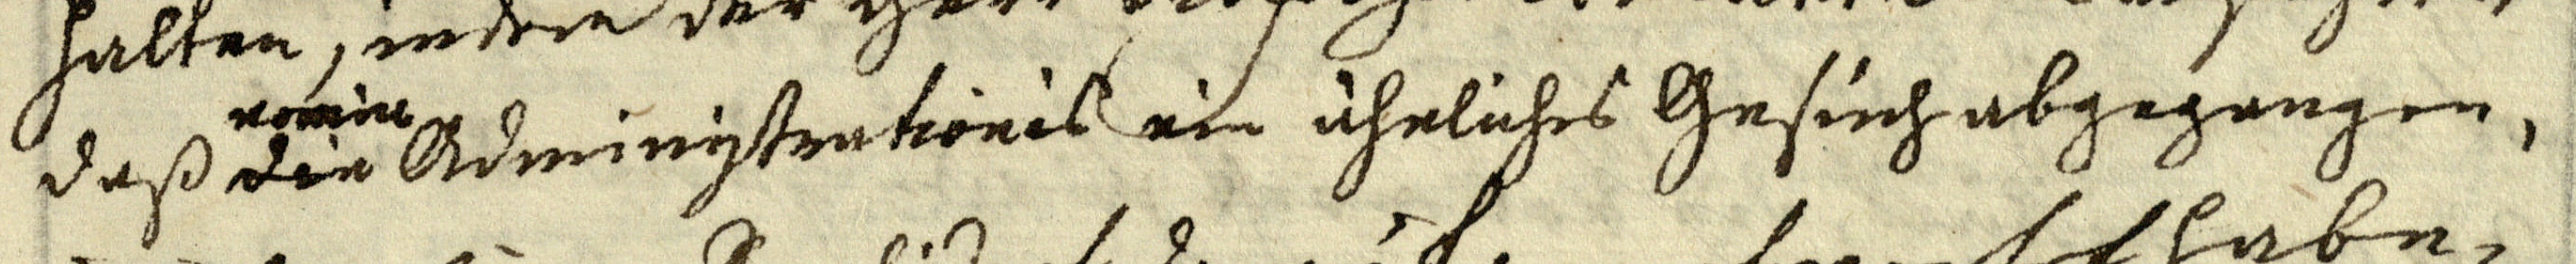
daß nomine Administrationis ein ähnliches Gesuch abgegangen,
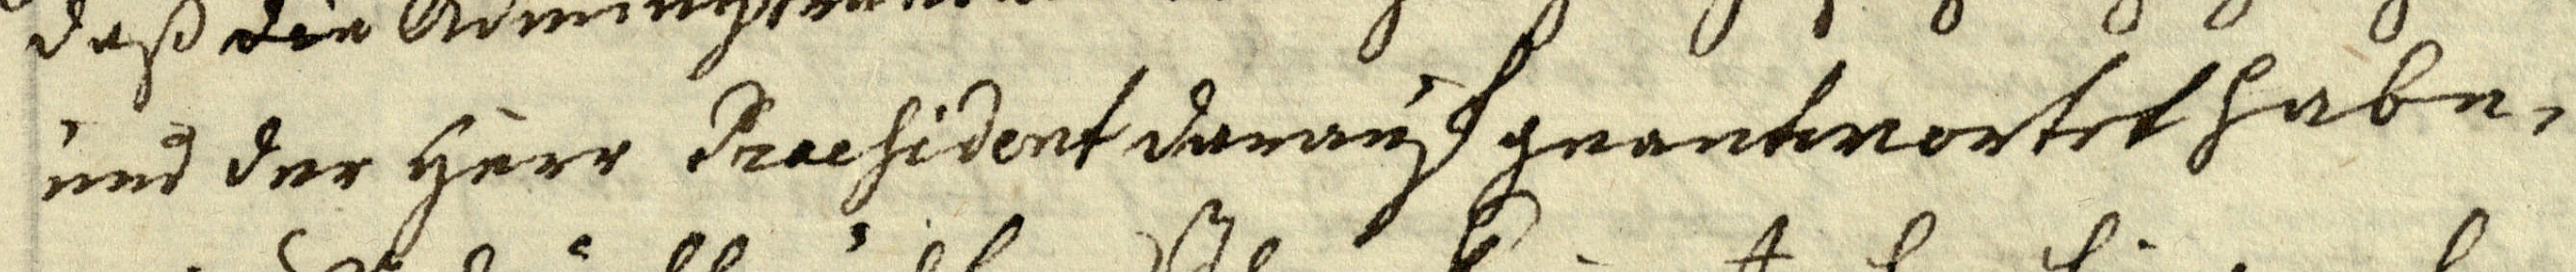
und der Herr Praesident darauf geantwortet habe,
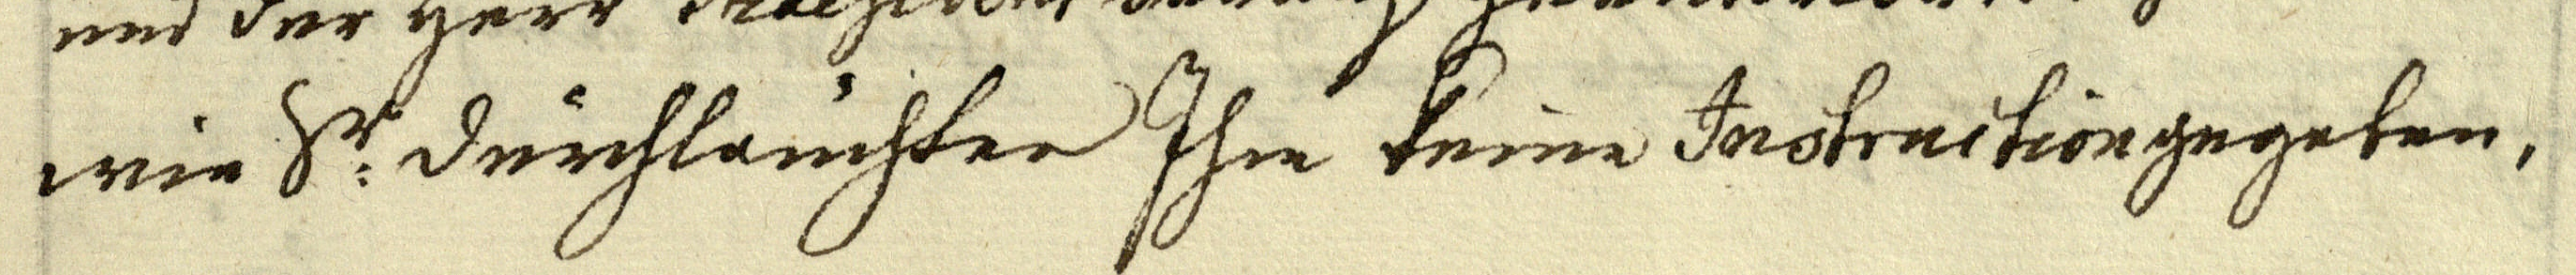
wie Sr Durchlauchten Ihm keine Instruction gegeben,
